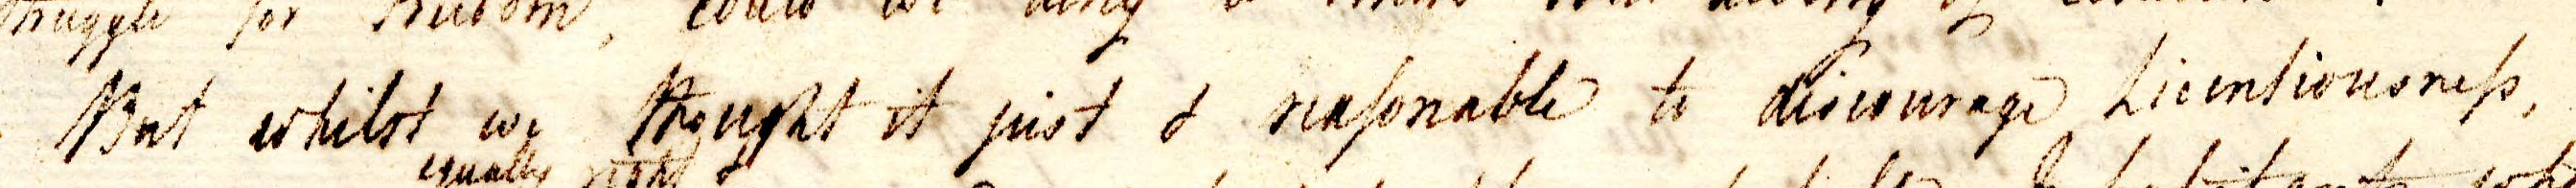But whilst we thought it just & reasonable to discourage Licentiousness,
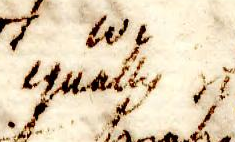equally right
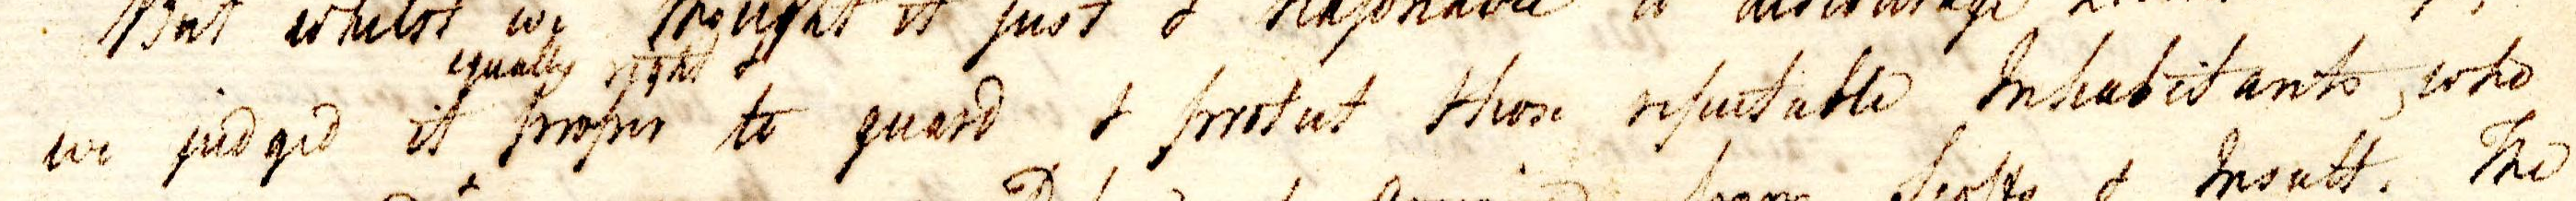we judged it ^ proper to guard & protect those respectable Inhabitants who
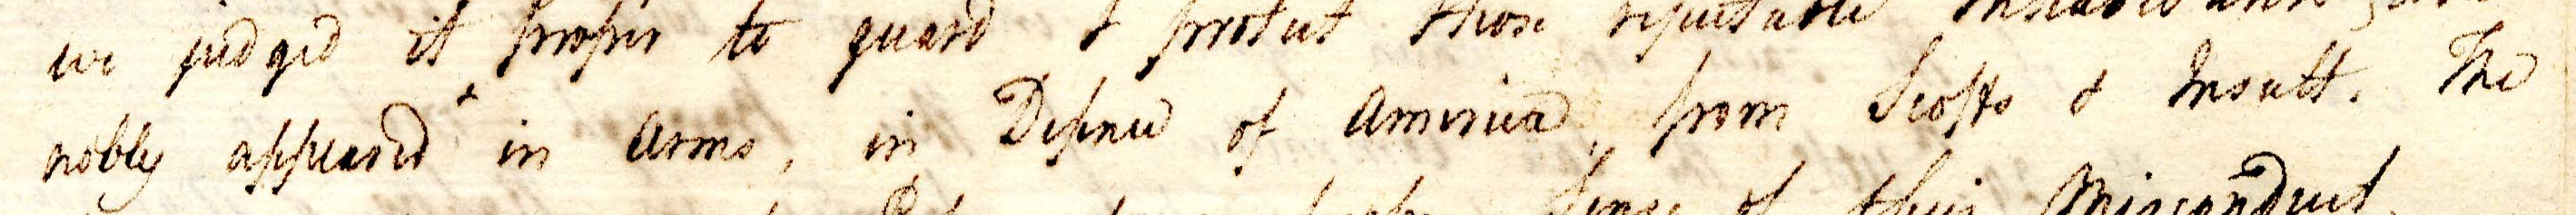nobly appeared in arms, in Defence of America, from Scoffs & Insult. The
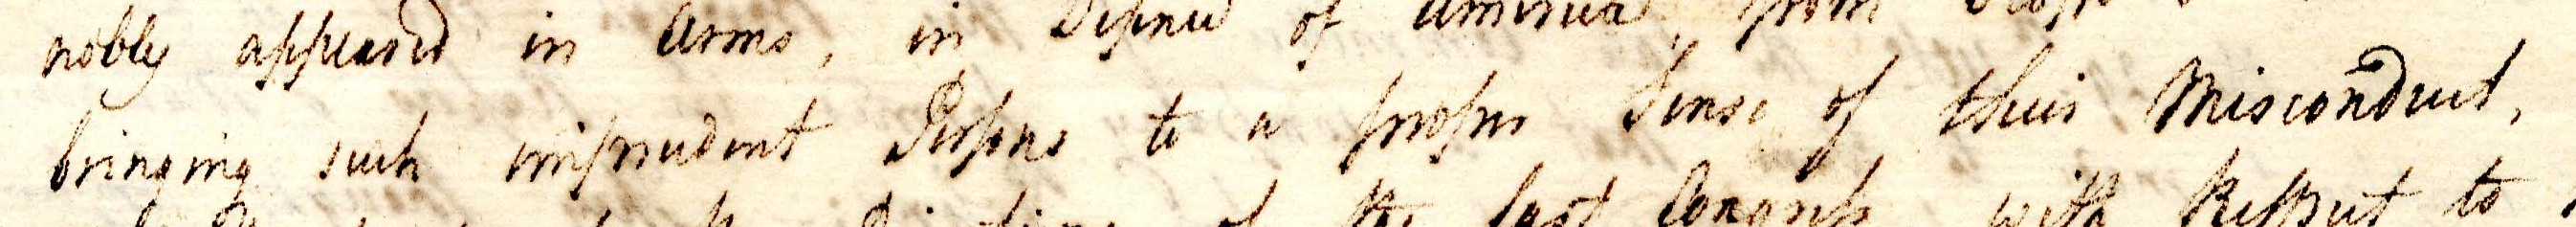bringing such impudent Persons to a proper Sense of their Misconduct,
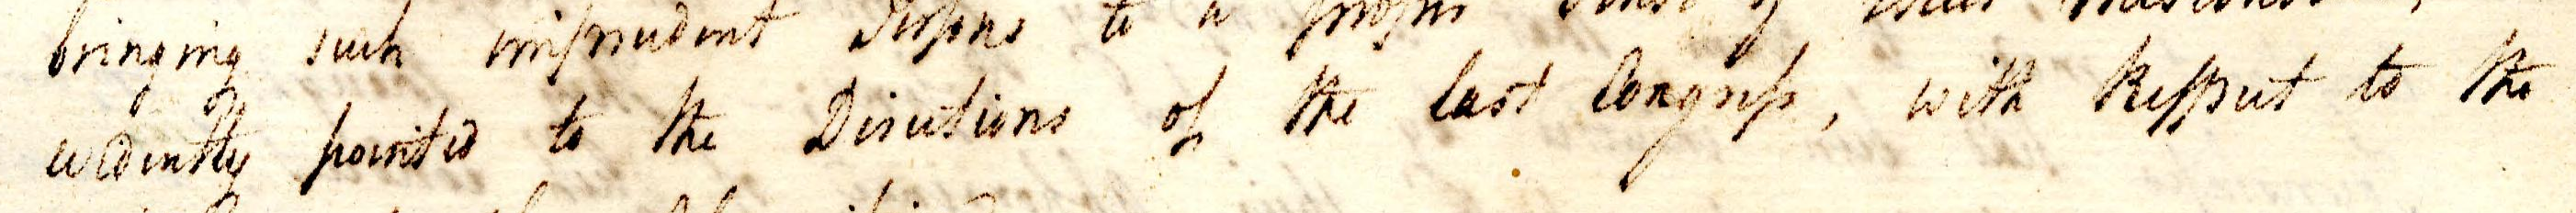evidently pointed to the Directions of the last Congress, with Respect to the
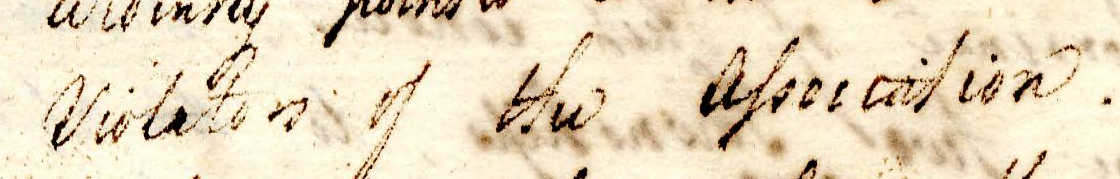Violations of the Association.
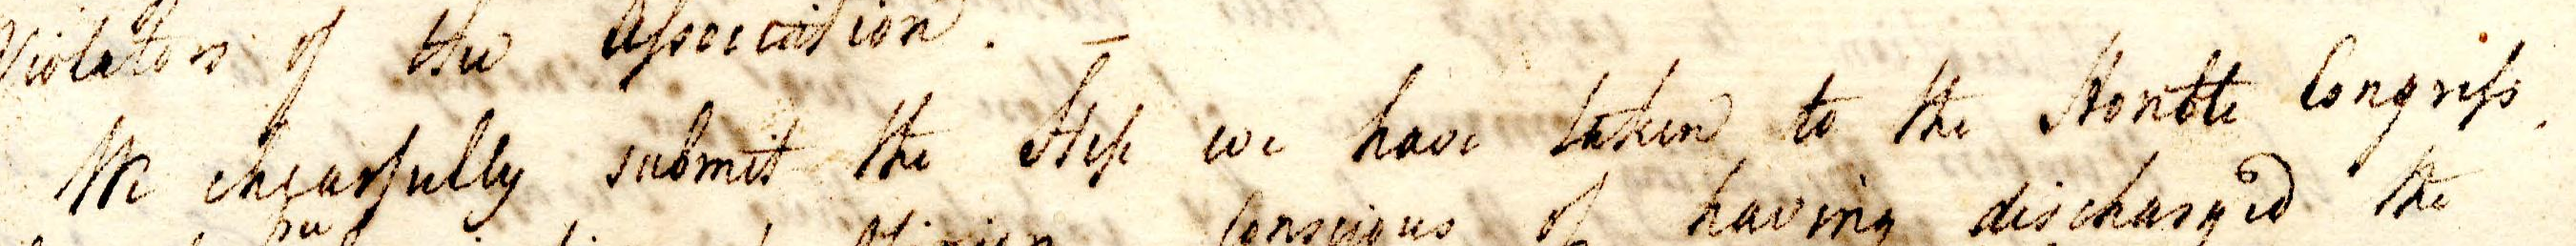We chearfully submit the Step we have taken to the Honble Congress
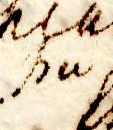free
